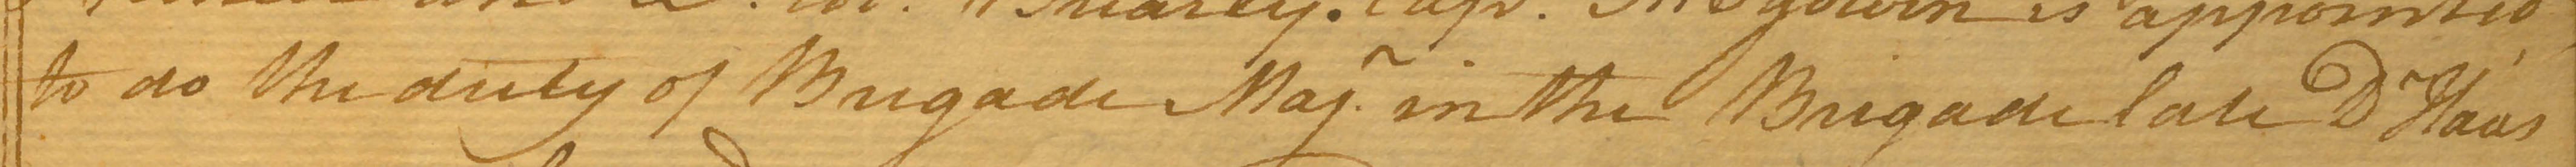to do the duty of the Brigade Maj^r. in the Brigade late D^r Haus
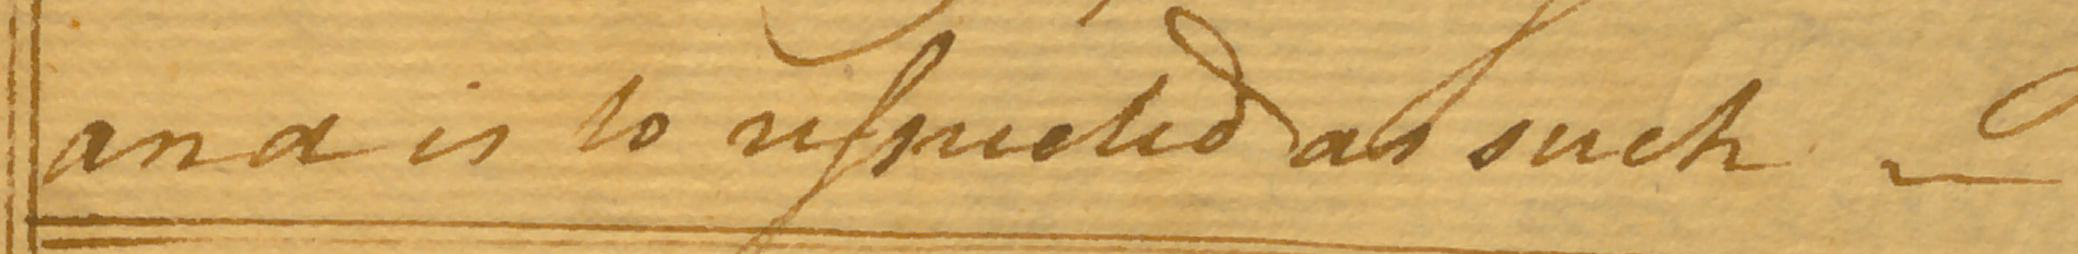and is to respected as such-
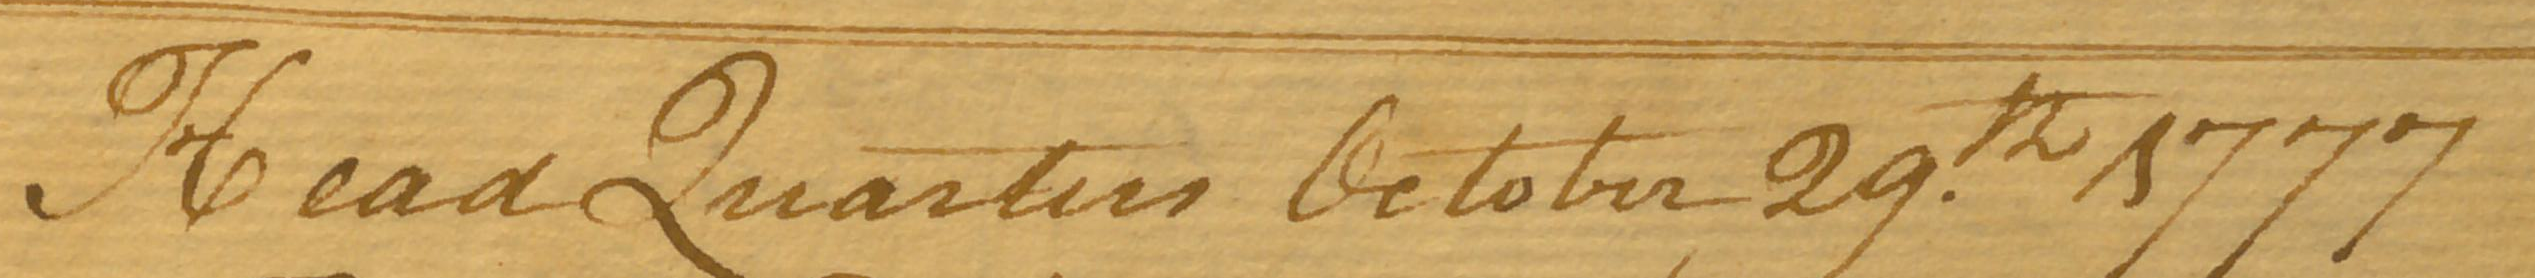Head Quarters October 29^th. 1777
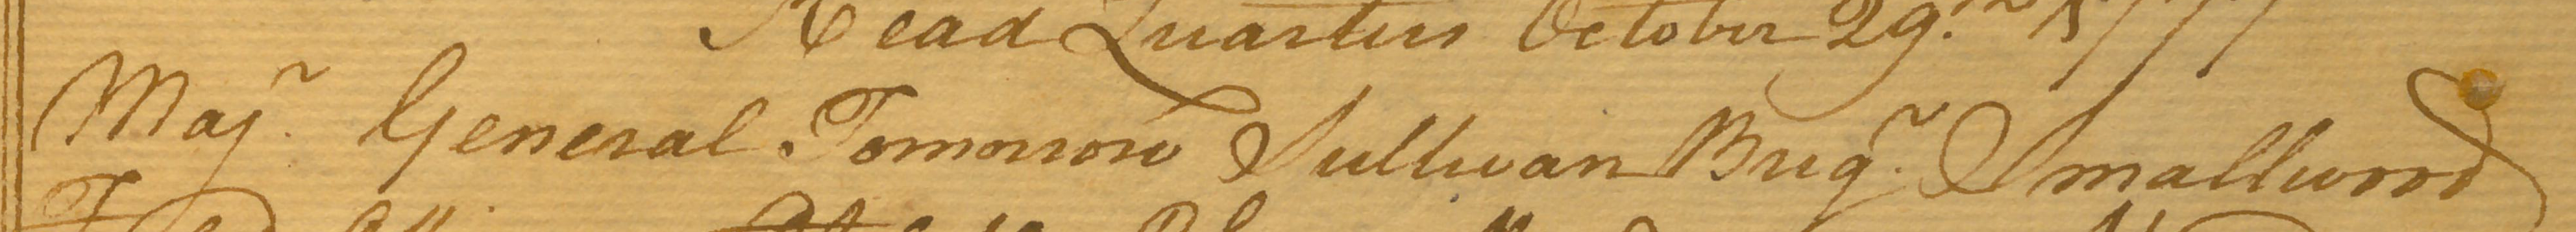Maj^r. General Tomorrow Sullivan Brig^r. Smallwood
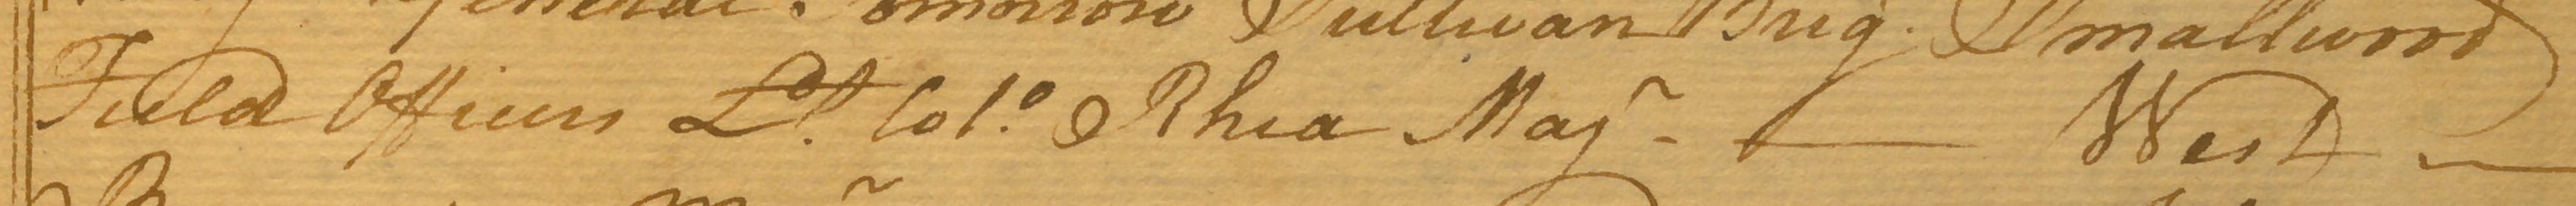Field Officers L^t. Col^o. Rhea Maj^r.- West-
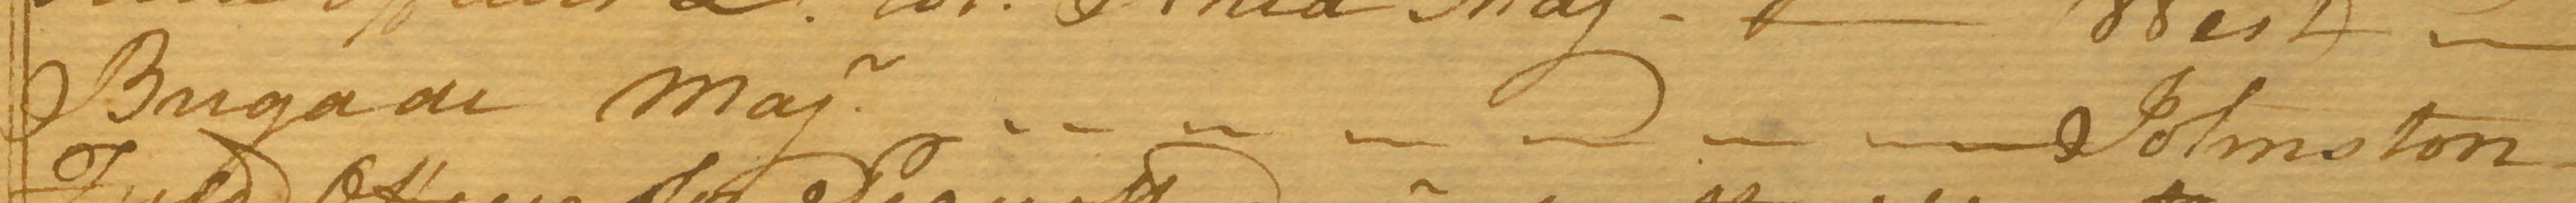Brigade Maj^r. - - - - - - Johnston
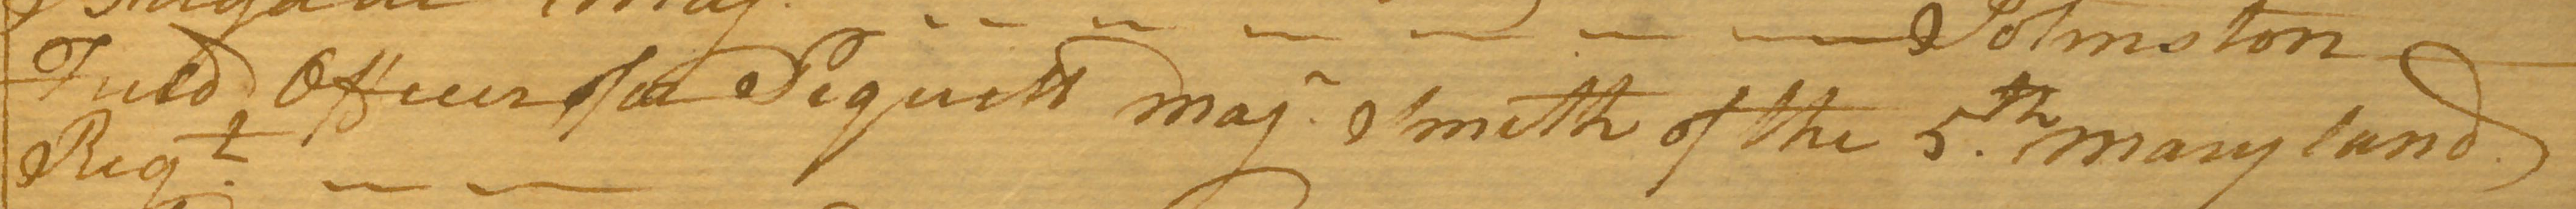Field Officer for Picquets Maj^r. Smith of the 5^th Maryland.
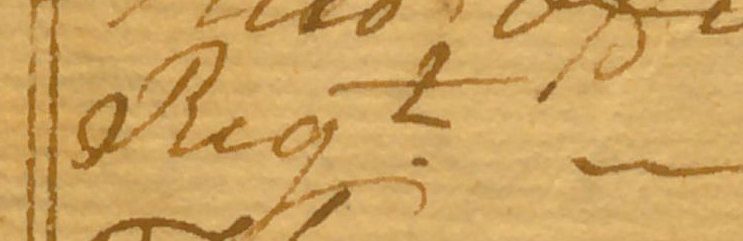Reg^t.-
